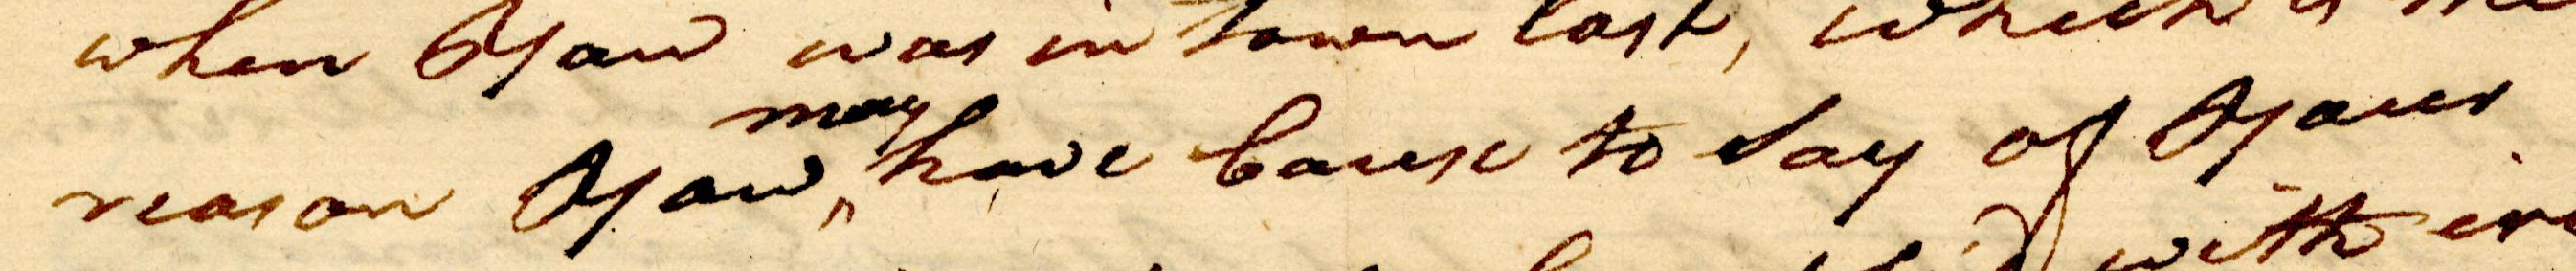reason You ^ have Cause to say of Your
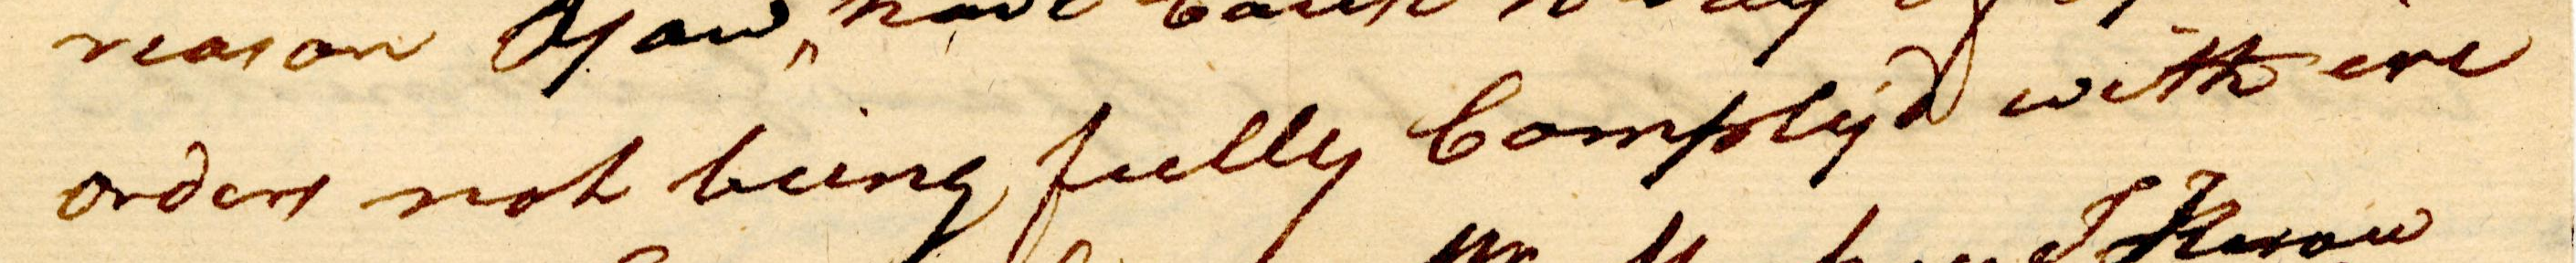order not being fully comply'd with one
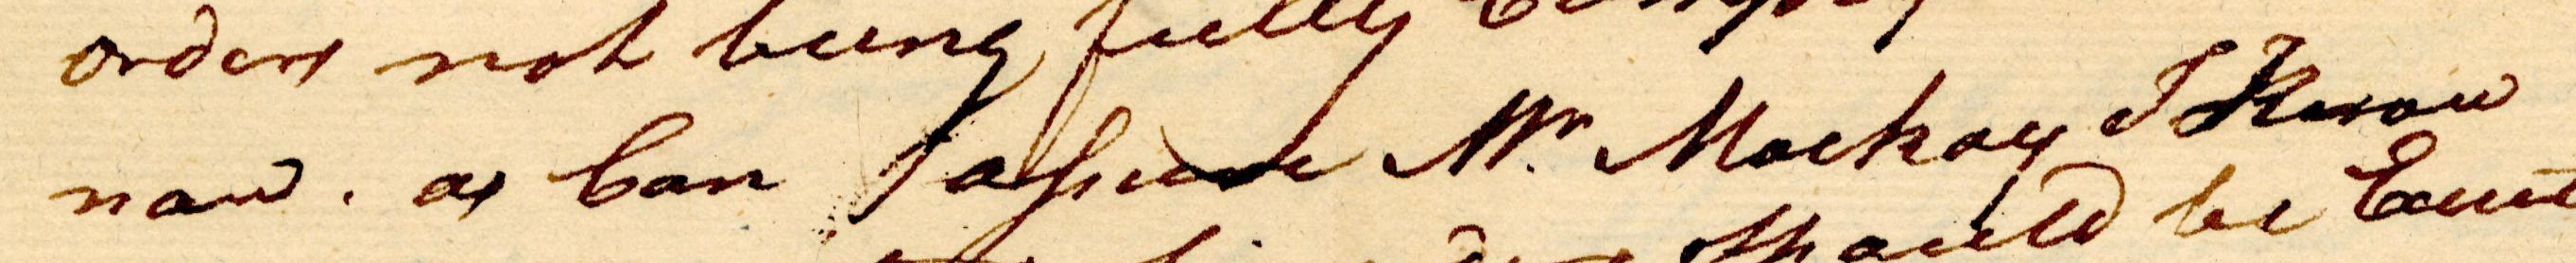now. as can I assure M^r Mackay I Know
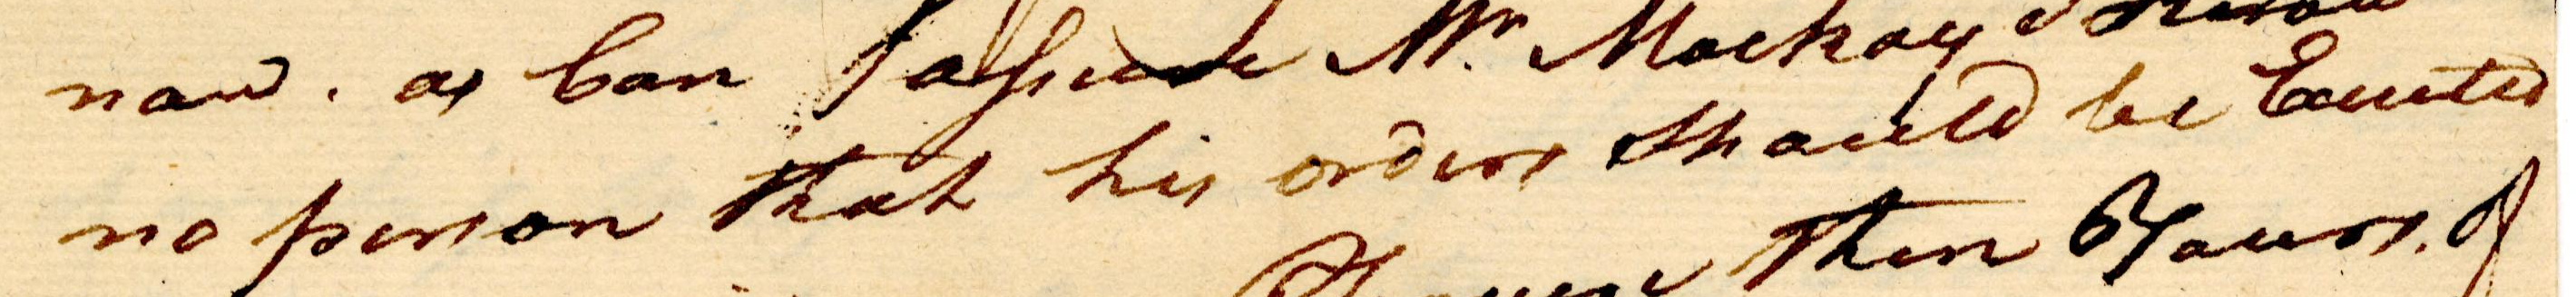no person that his orders should be Executed
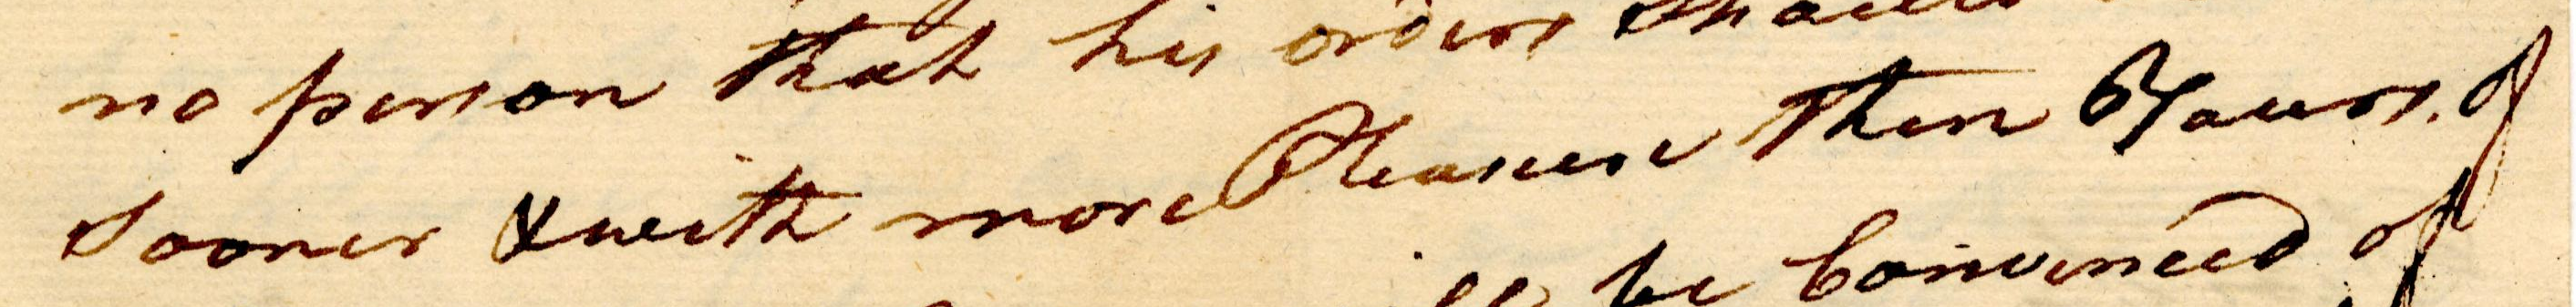sooner & with more Pleasure than Yours of
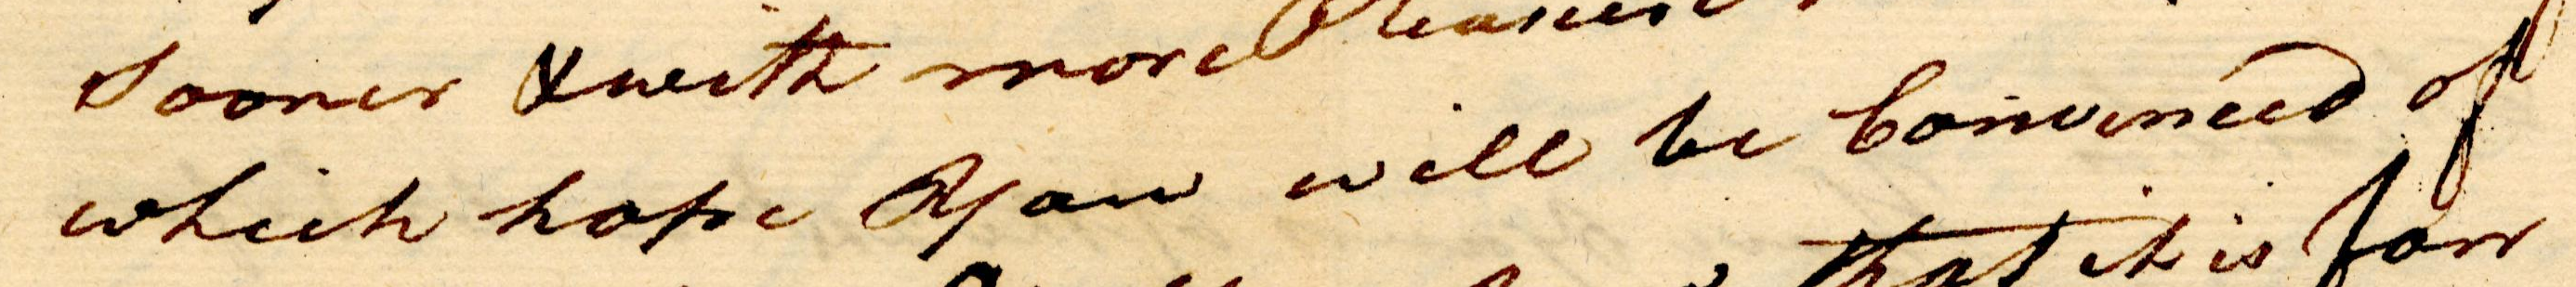which hope you will be convinced of
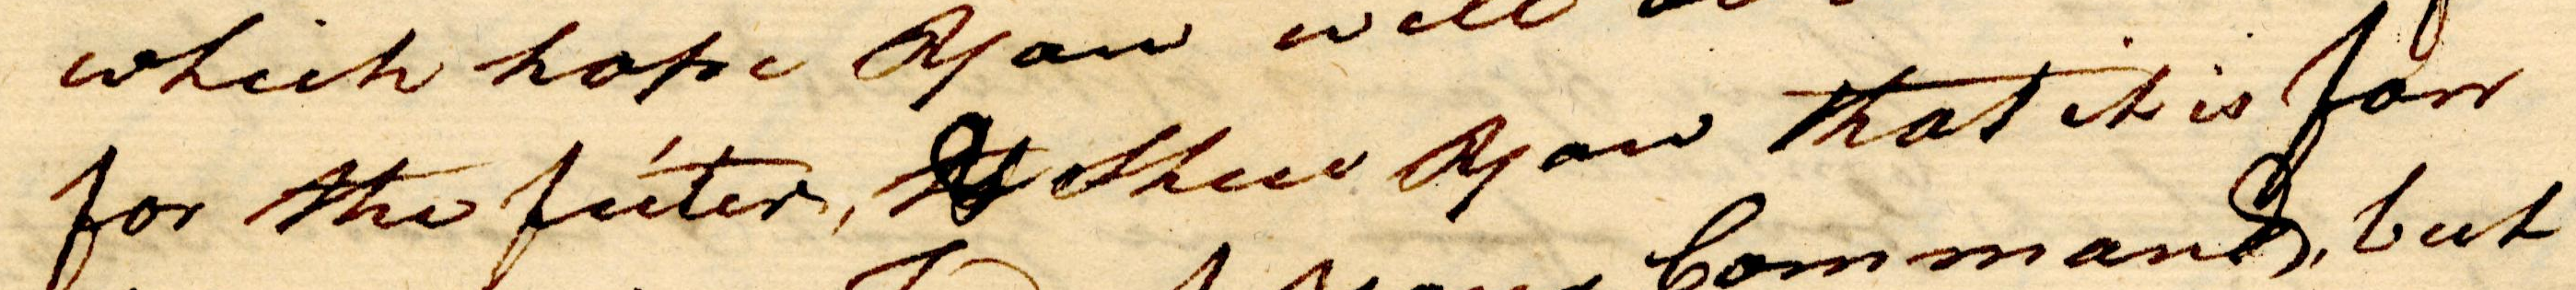for the letter, [_] shew you that it is far
